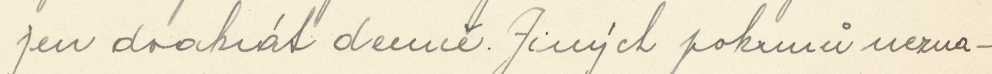jen dvakrát denně. Jiných pokrmů nezna-
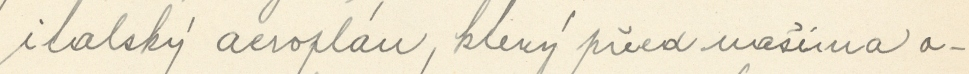italský aeroplán, který před našima o-
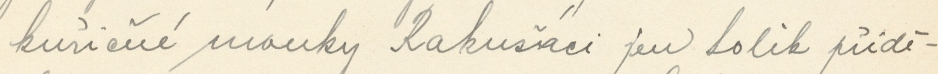kuřičné mouky Rakušáci jen tolik přidě-
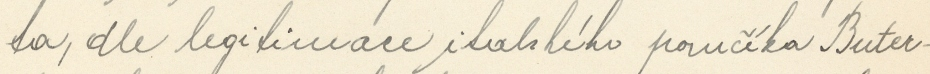ta, dle legitimace italského poručíka Buter-
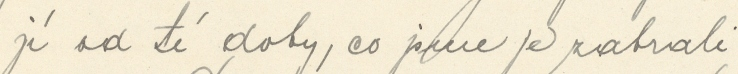jí od té doby, co jsme je zabrali.
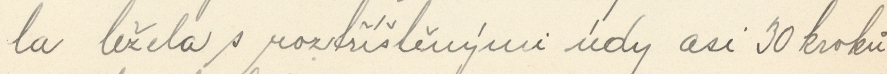la ležela s roztříštěnými údy asi 30 kroků
